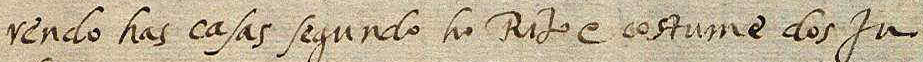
rendo has casas segundo ho Rito e costume dos Ju
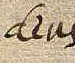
deus
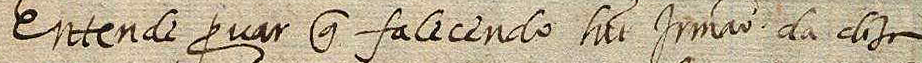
Entende ꝓuar q̅ falecendo hu̅ Jrmão da dita
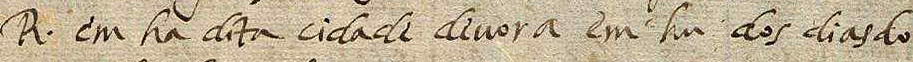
R. em ha dita cidade deuora em hu dos dias do
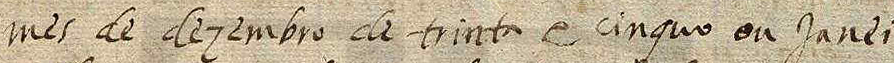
mes de dezembro de trinta e cinquo en Janei
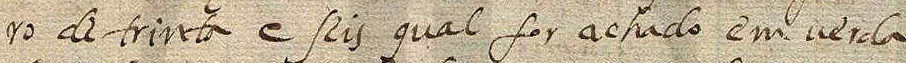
ro de trinta e seis qual for achado em uerda
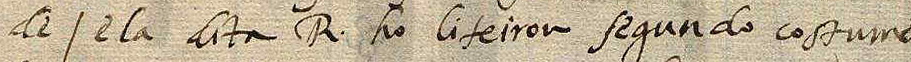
de / ela dita R. ho liteirou segundo costume
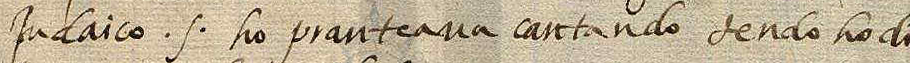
Judaico .s. ho pranteaua cantando tendo ho di
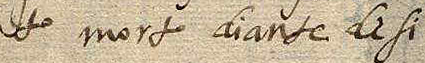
to morto diante de si
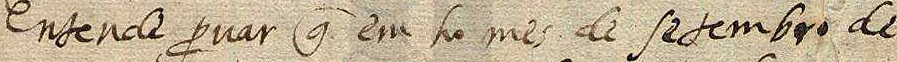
Entende ꝓuar q̅ em ho mes de setembro de
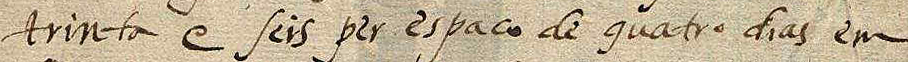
trinta e seis per espaco de quatro dias em
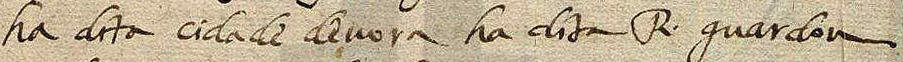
ha dita cidade deuora ha dita R. guardou
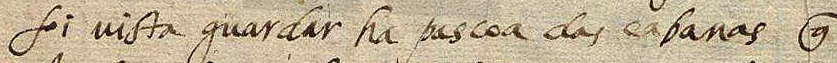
e foi uista guardar ha pascoa das cabanas q̅
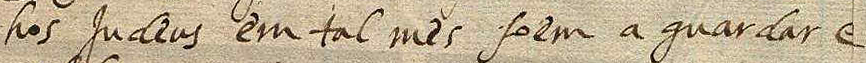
hos Judeus em tal mes soem a guardar e
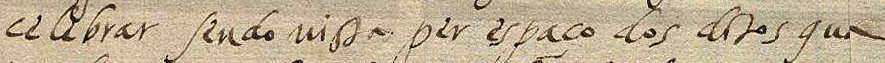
celebrar sendo uista per espaço dos ditos qua
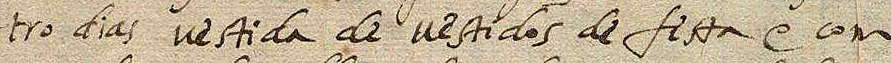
tro dias uestida de uestidos de festa e com
